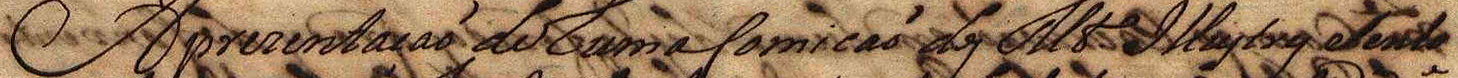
Aprezentaçaõ de huma Comiçaõ dos Mt.o Illustres Senho
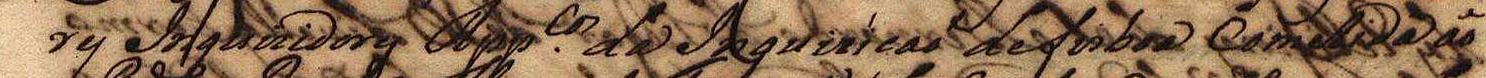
res Inquizidores App.cos da Inquiziçaõ de Lisboa cometida ao
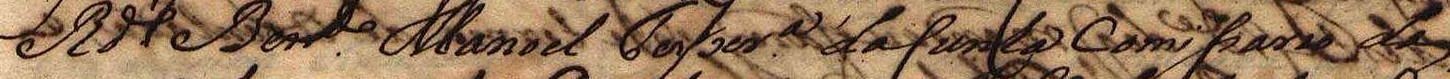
Rd.o Ben.do Manoel Teyxr.a da Cunha Comissario da
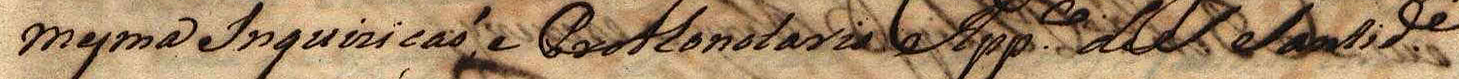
mesma Inquiziçaõ, e Prothonotario App.ro de S Santid.e
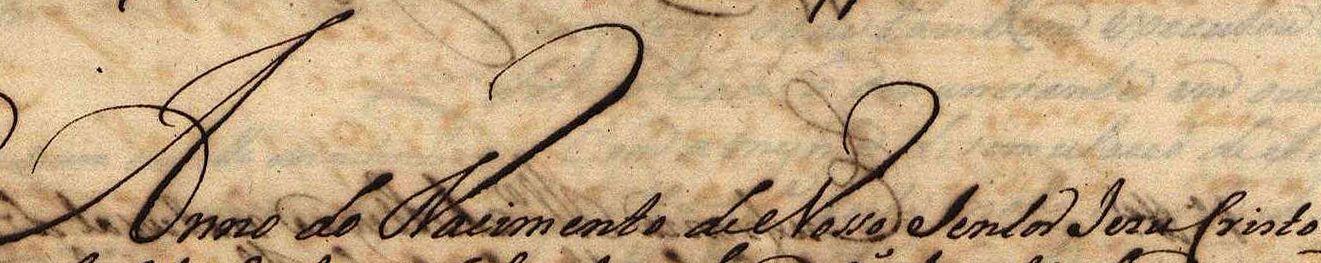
Anno do Nacimento de Nosso Senhor Jezu Cristo
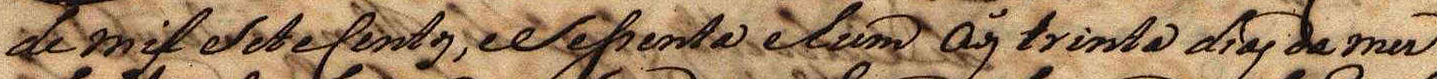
de mil SeteCentos, e Sessenta e hum aos trinta dias do mez
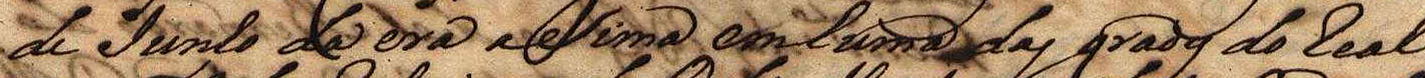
de Iunho da era aSima em huma das grades do Real
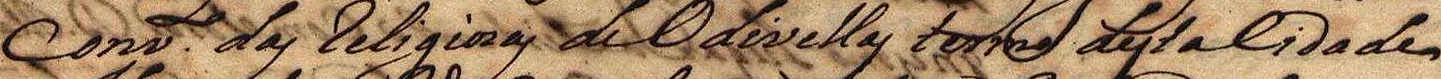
Conv.to das Religiozas de Odivellas terra desta Cidade
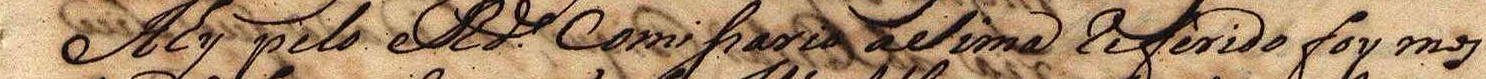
Ahy pelo Rd.o Comissario aSima Referido foy mos
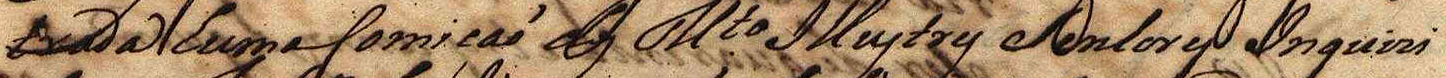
trada huma Comiçaõ dos M.to Illustres Senhores Inquizi
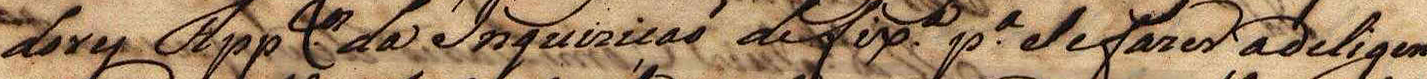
dores App.cos da Inquiziçaõ de Lix.a p.a se fazer a deligen
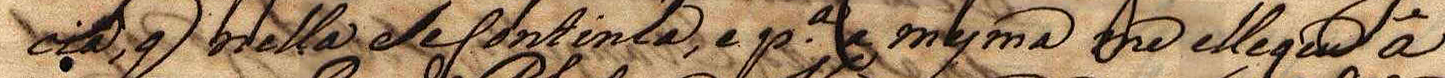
cia, q̄ nella Se Continha, e p.a a mesma me ellegeu â
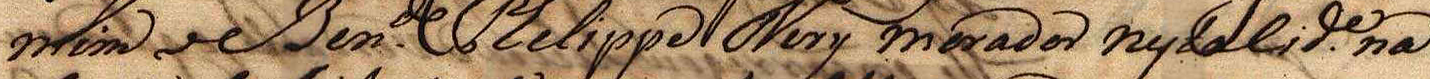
mimo Ben.do Philippe Nery morador nesta Cid.e na
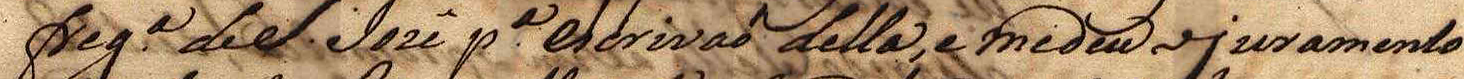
freg.a de S. Iozê p.a escrivaõ della, e me deu o juramento
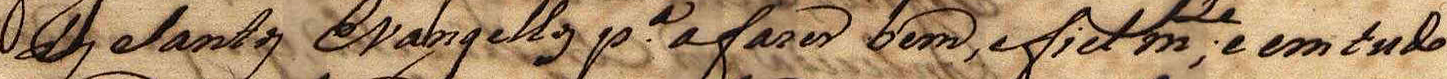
dos Santos Evangelhos p.a a fazer bem, e fielm.te, e em tudo
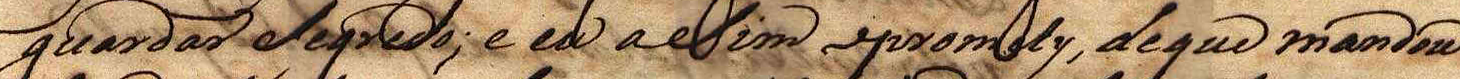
guardar Segredo; e eu aSim o promety, de que mandou
